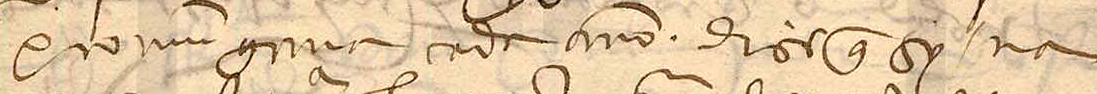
e comūgaua cada an̄o. dise q̄ sy / na
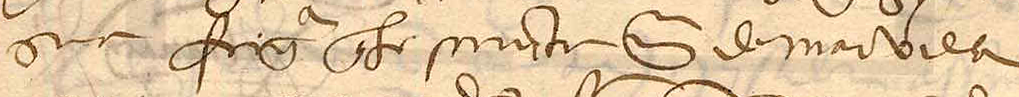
sua frega q̄ he sancta m̄ de marvila
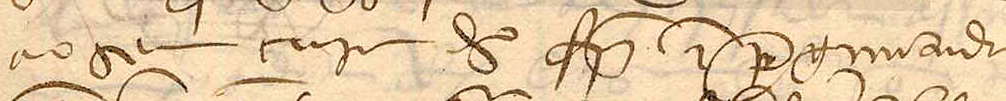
ao seu cura do fr̄z item p̄gumtada
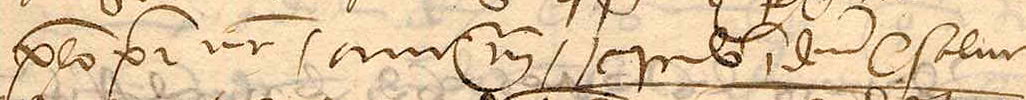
p̄lo pī noso / ave m̄ / credo idem e salue
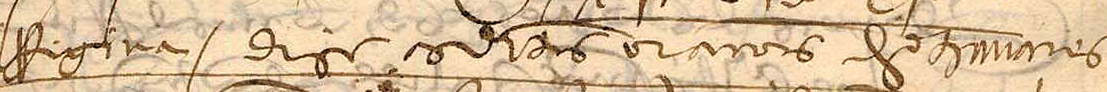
Regina / dise as ditas oracões do trauacos
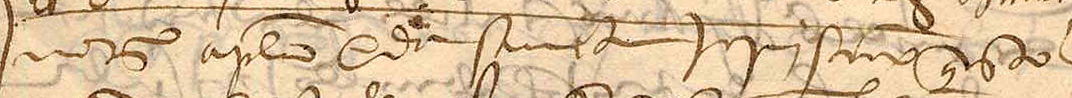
notro apl̄o e da sancta Jnqjsiçã̄ q̄ isto
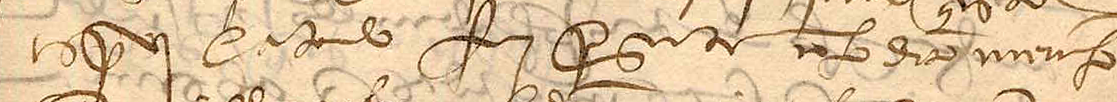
esp̄vj e a todo foj p̄sēte c̄o ho dito men̄ho
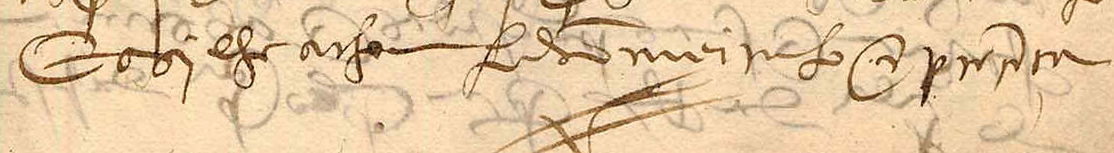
E asj lhe achou ho dt̄o meirinho ē presēça
